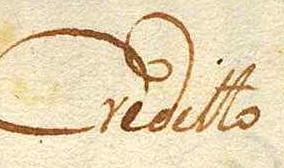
Creditto
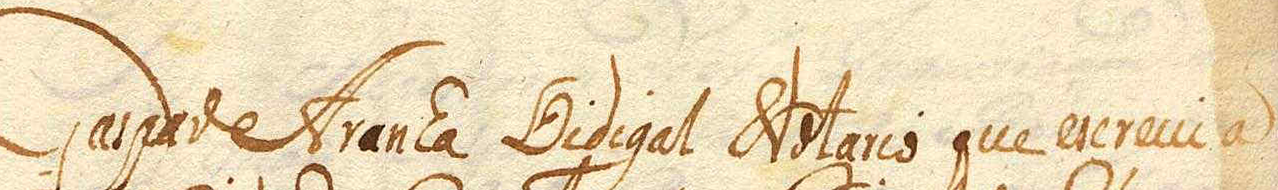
Gaspar Aranha Vidigal Notario que escreui a
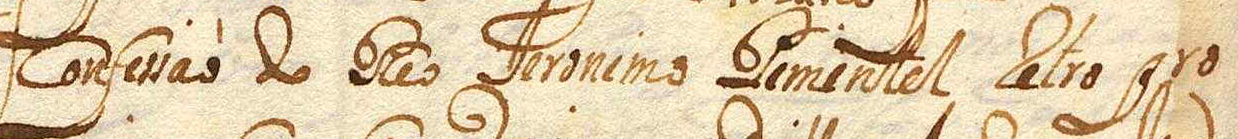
Confessaõ do Reo Ieronimo Pementel Retro pro
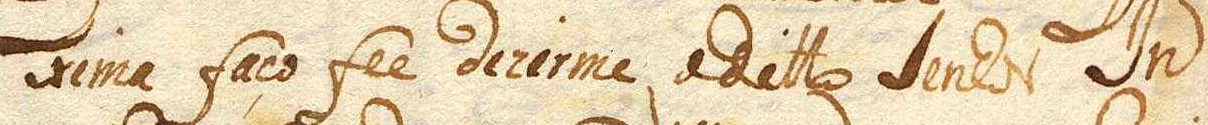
xima faço fee dizerme o ditto Senhor In
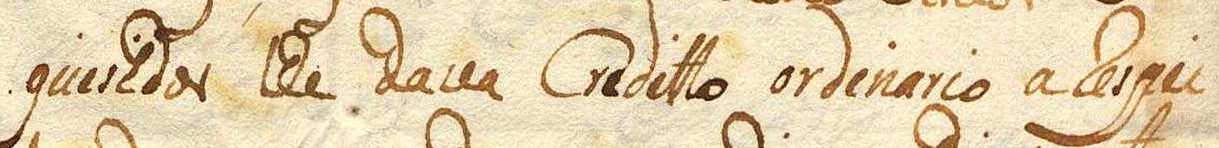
quisedor lhe daua Creditto ordinario a Respei
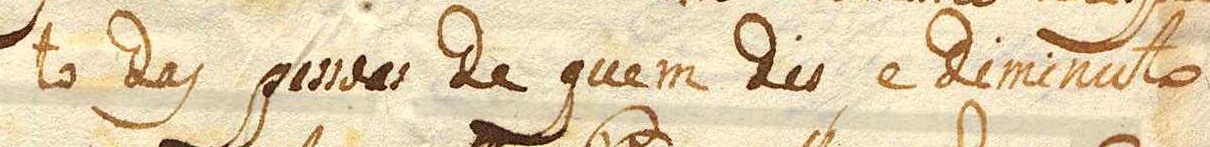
to das pessoas de quem dis e diminuto
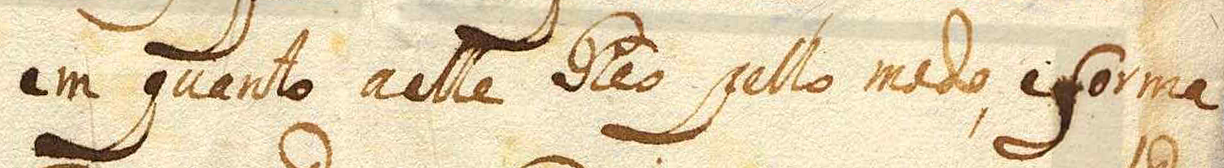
emquanto a elle Reo pello modo, e forma
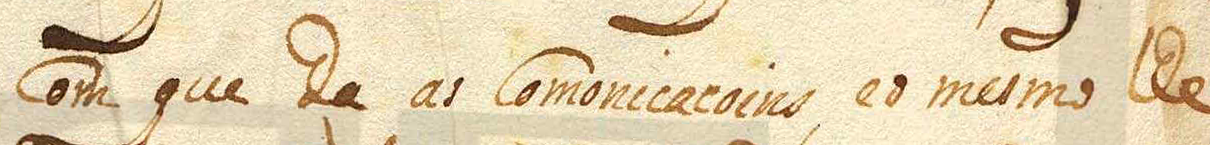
Com que da as Comonicacoins, e o mesmo lhe
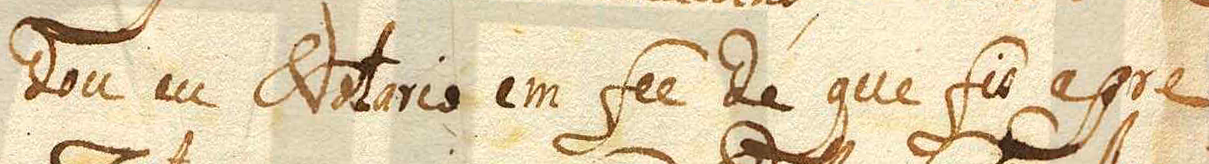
dou eu Notario em fee de que fis a pre
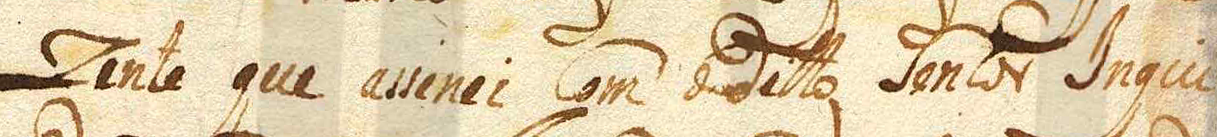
Zente que assinei Com o ditto Senhor Inqui
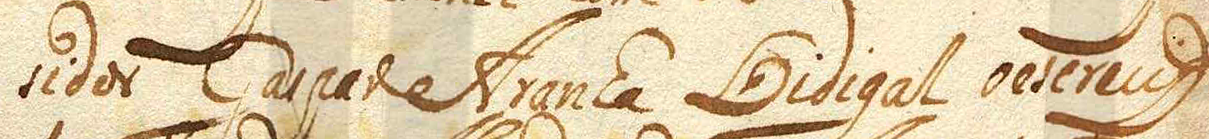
sidor Gaspar Aranha Vidigal o escreuj
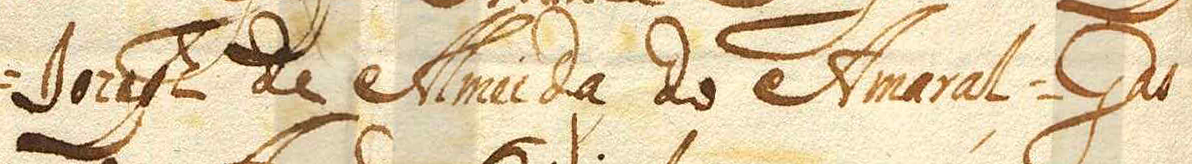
Iozeph de Almeida do Amaral = Gas
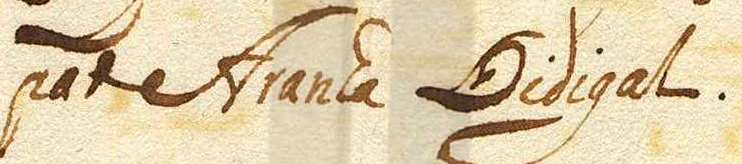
par Aranha Vidigal.
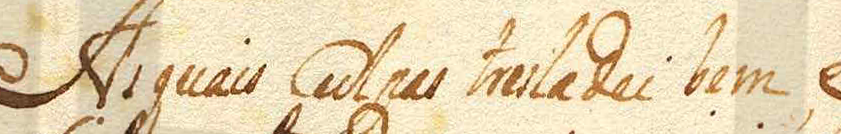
As quais Culpas tresladei bem, e
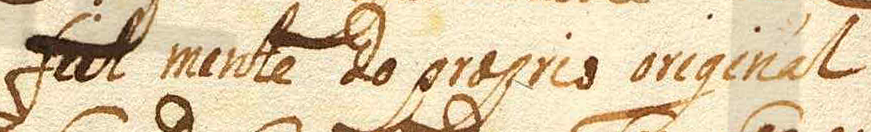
fielmente do proprio orginal
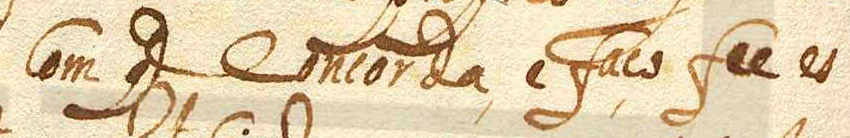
Com q̄ Concorda, e faço fee es
